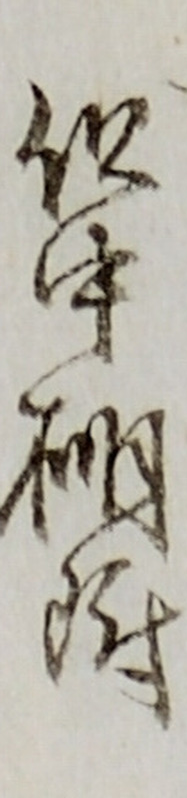但中棚附
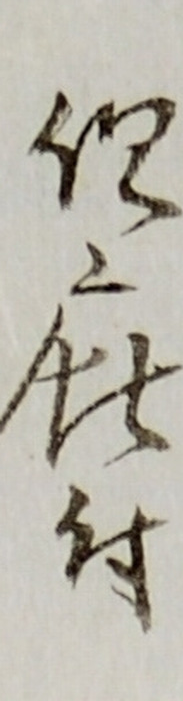但庇付
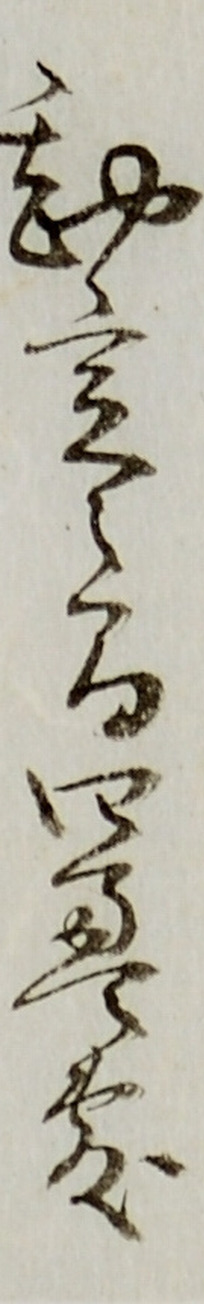勘定之間四畳敷
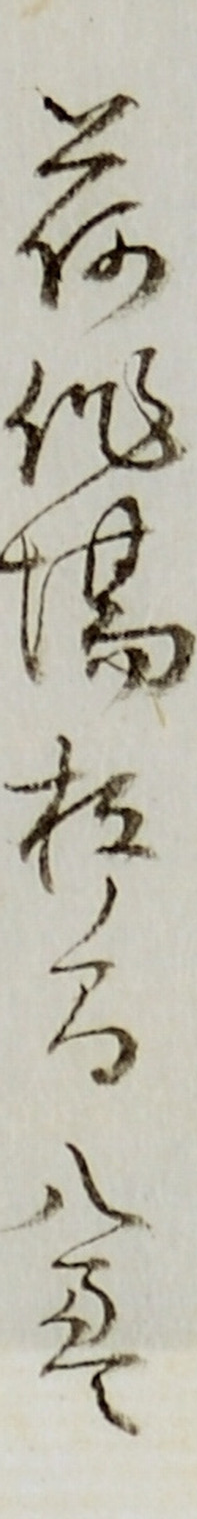荷作場板ノ間八畳
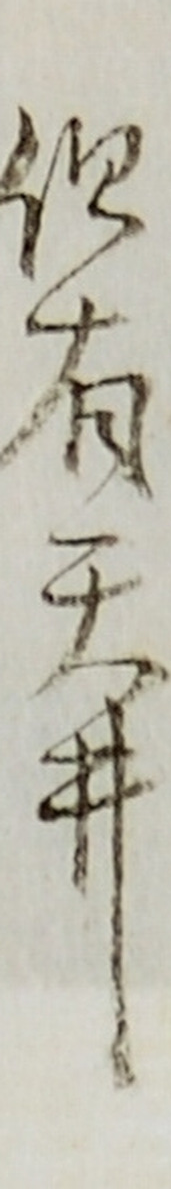但有天井
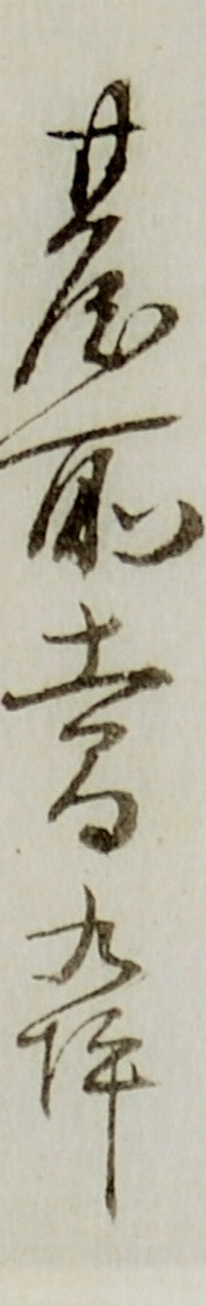台所土間九坪
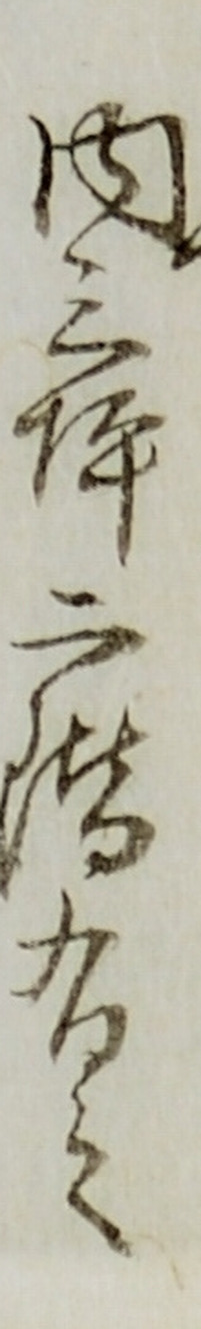内三坪二階有之
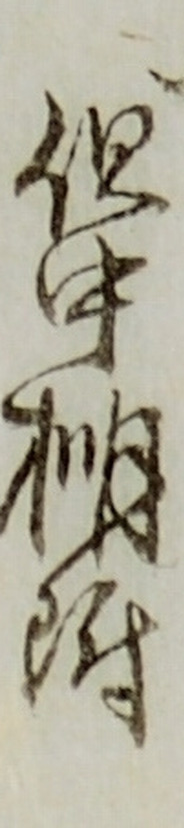但中棚附
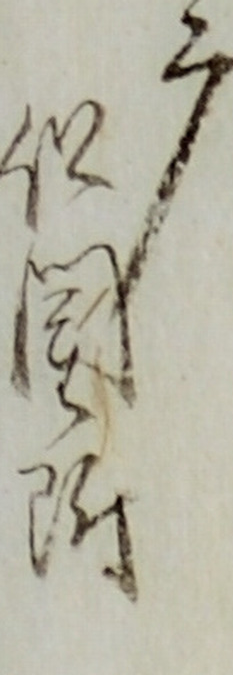但関附

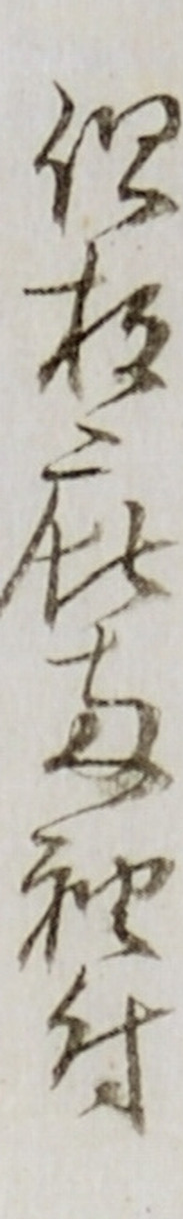但板庇両袖付
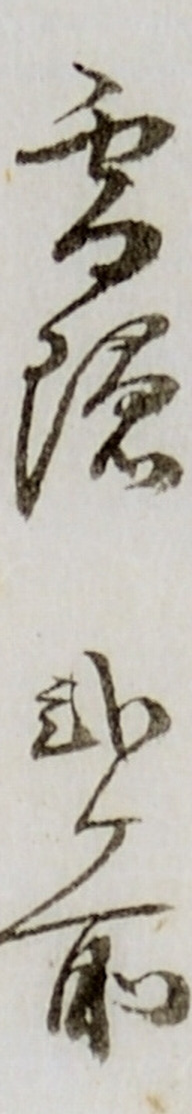雪隠弐ヶ所
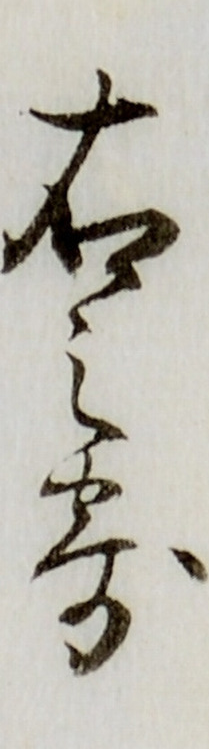右之寄
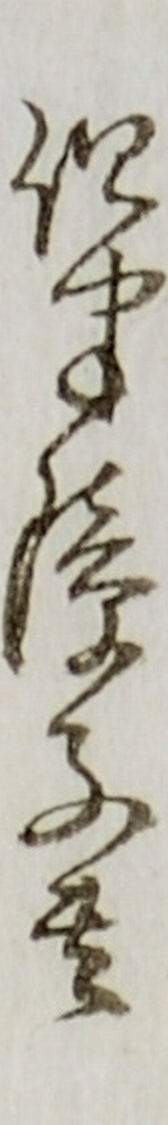但半障子共
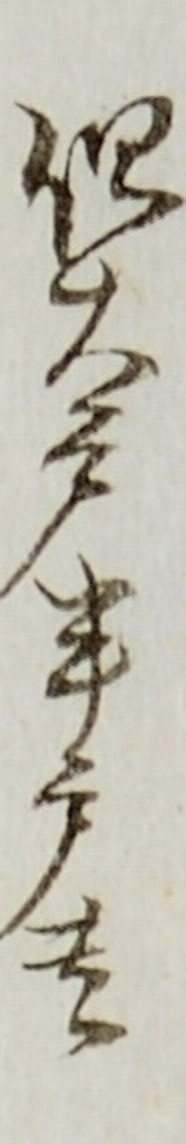但大戸半戸共
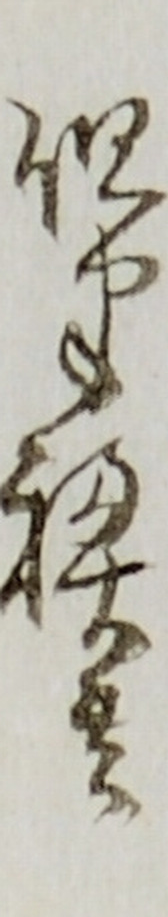但半襖共

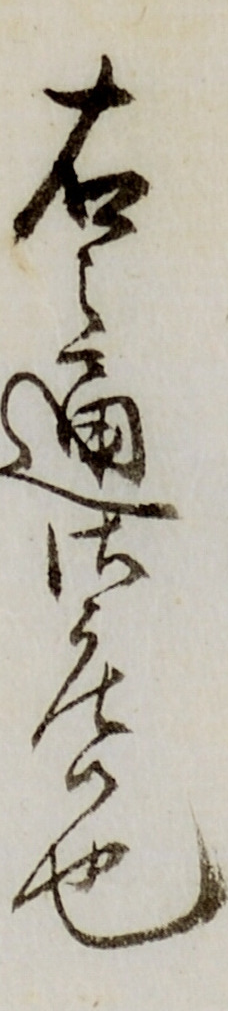右之通御座候也
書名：山林方諸事御用留
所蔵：伊那市立高遠町図書館・合同会社AMANE
